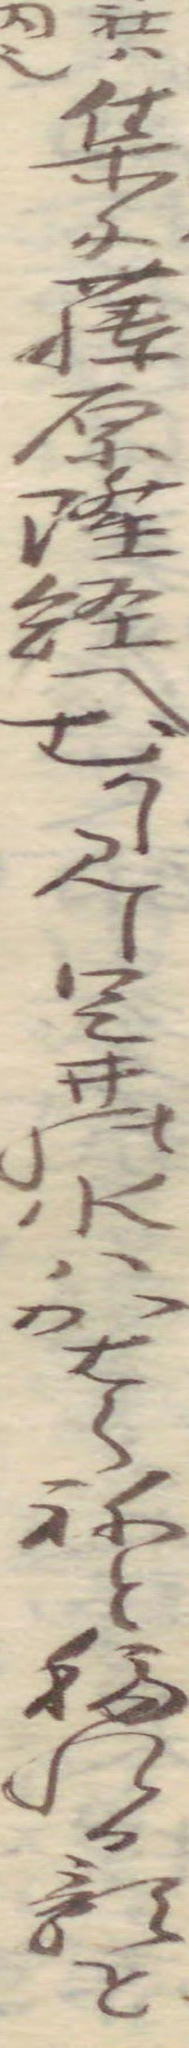集に藤原隆経〽むかし見し足井の水はかはらねと移れる影そ
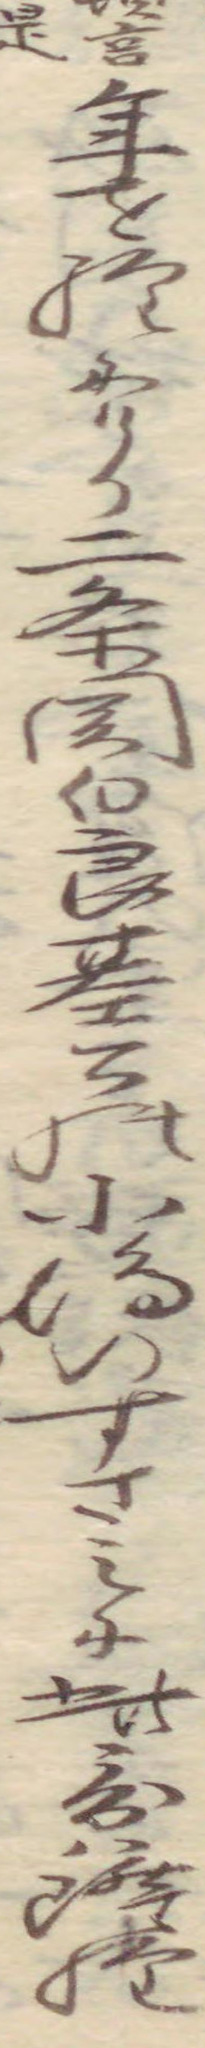年を経にけり二条関白良基公の小島のすさみに此歌は隆経
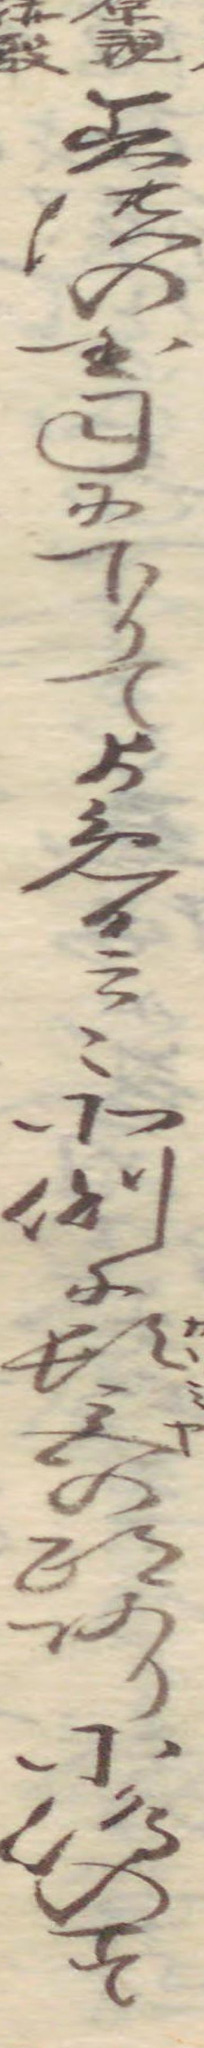美濃の国司に下りてよめる云〻北側に頓宮の跡あり小嶋のす
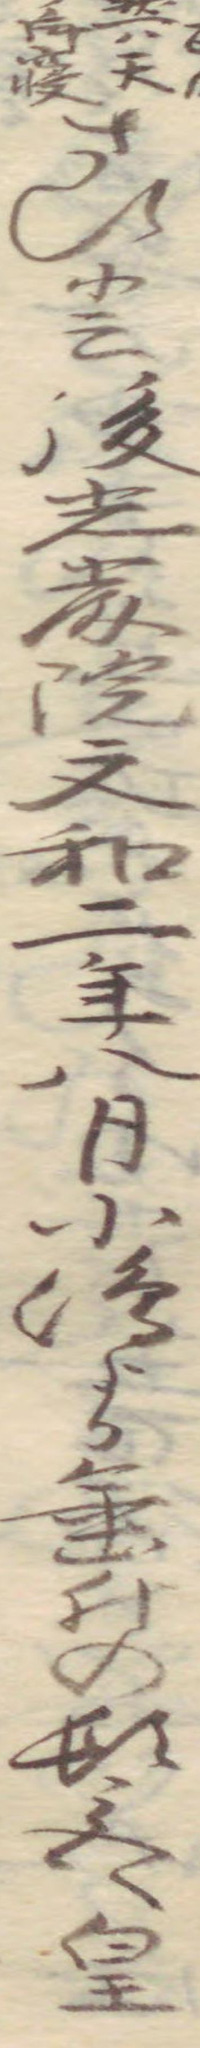さひに云後光厳院文和二年八月小嶋より垂井の頓宮へ皇
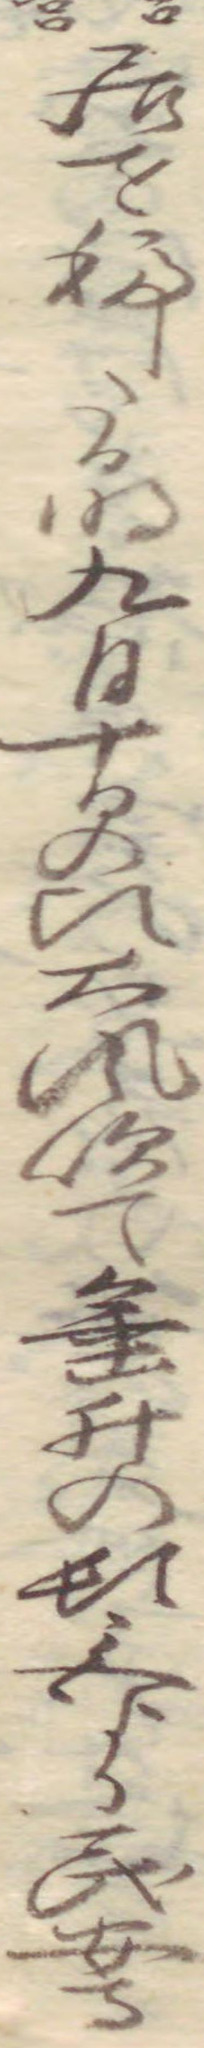居を移したる時九月十日の比大風吹て垂井の頓宮より民安寺
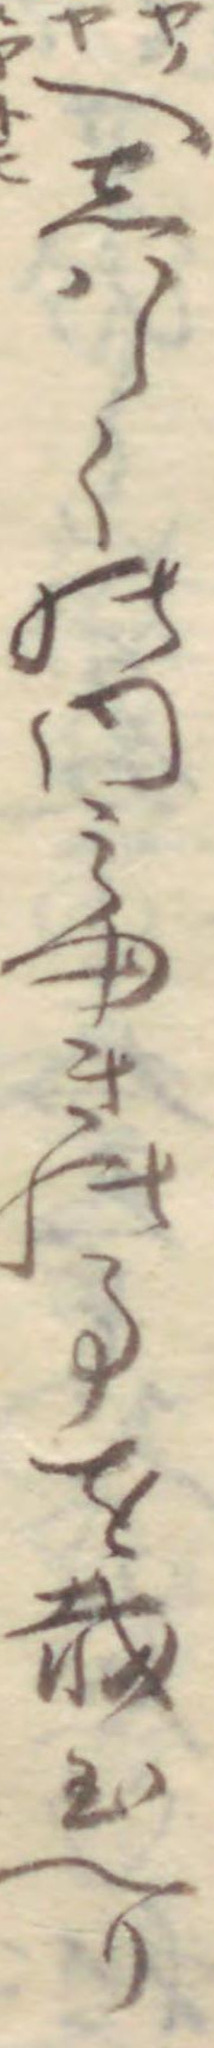へしはらくの内みゆきの事を截玉へり
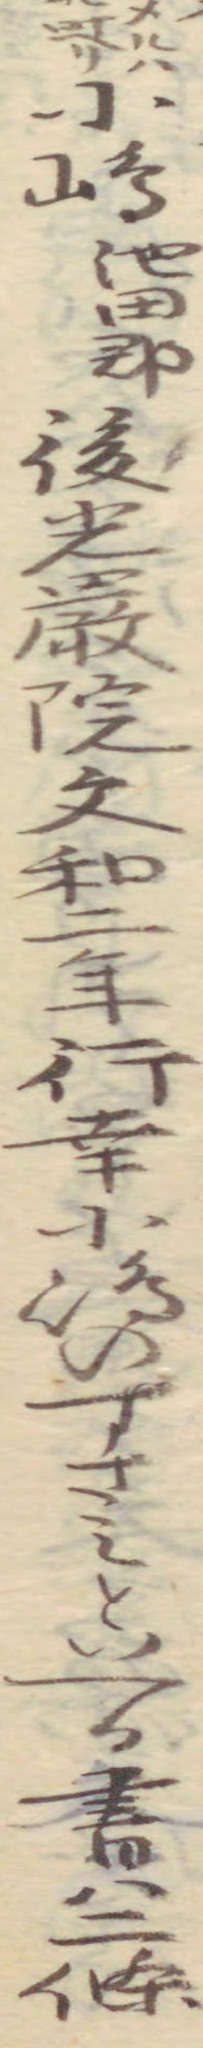小嶋池田郡後光厳院文和二年行幸小嶋のすさみといへる書は二條
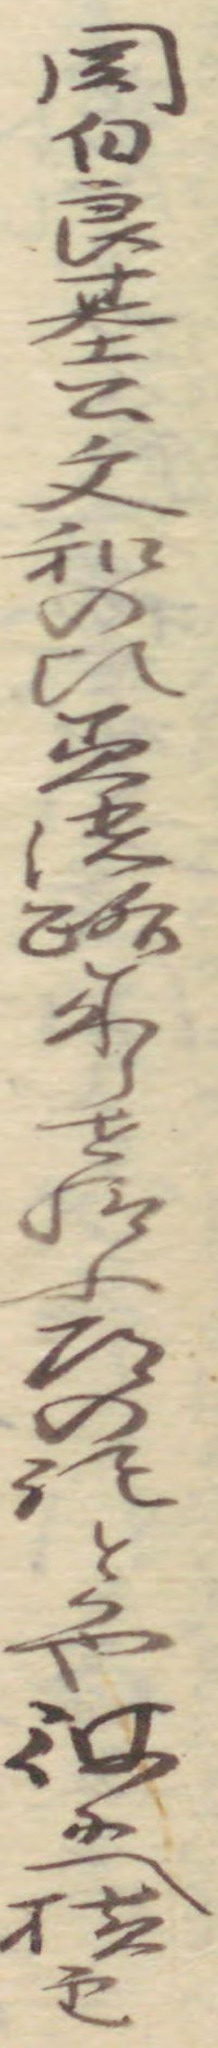関白良基公文和の比美濃路参らせ給ふ道の記とかや彼に〽横雲
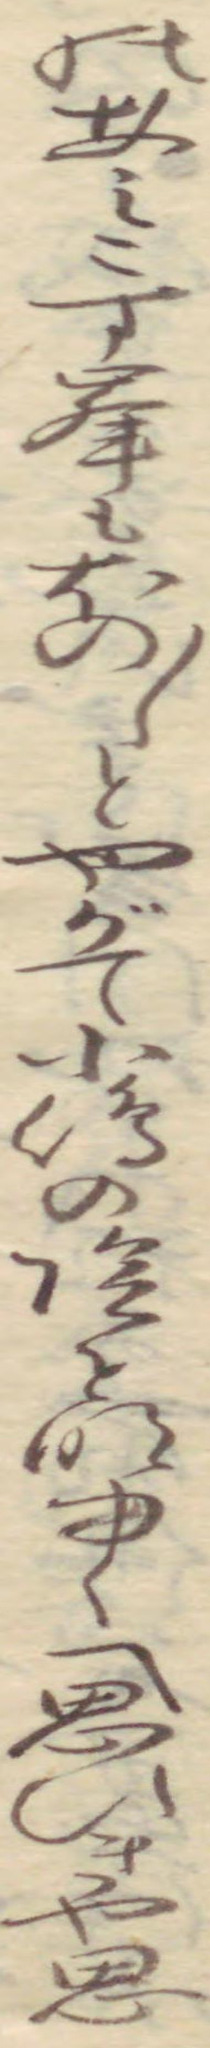のなみこす峰もほの〳〵とやがて小島の陰そ明ゆく〽思ひきや思
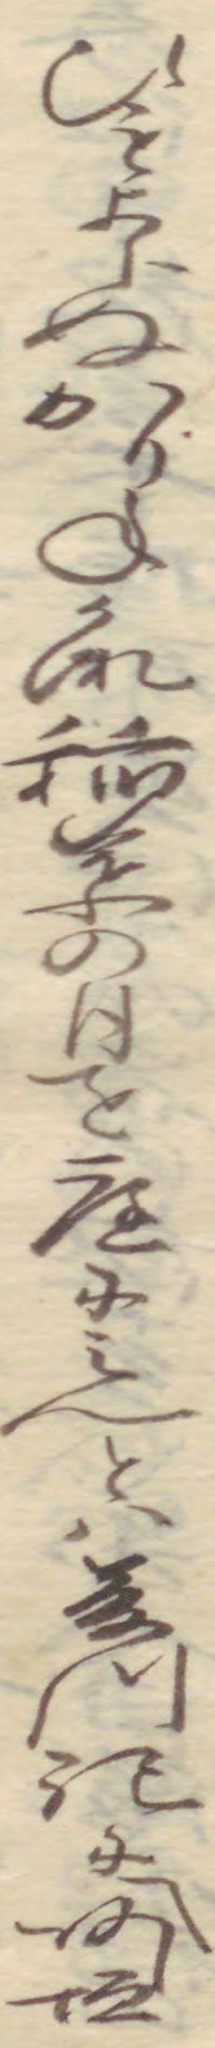ひもよらぬかりねかな稲葉の月を庭にみんとは藤川記に〽あし垣
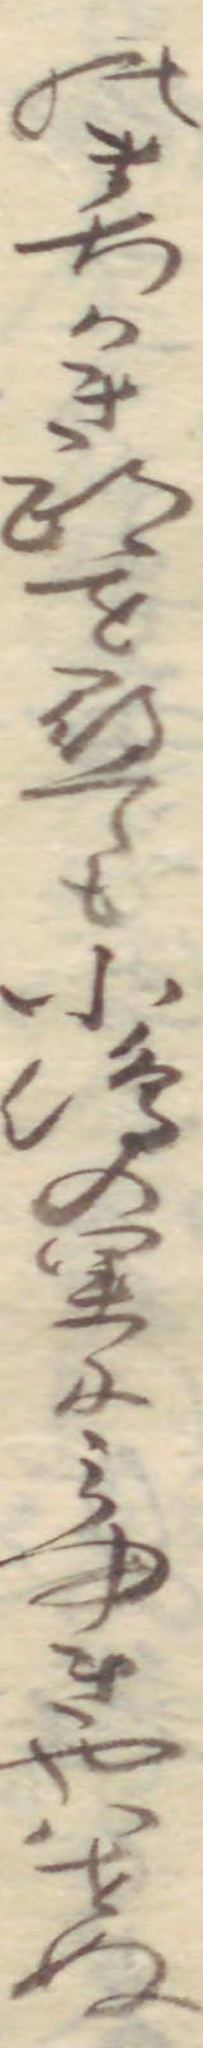のまちかき跡を尋ても小島の里にみゆきやはせぬ
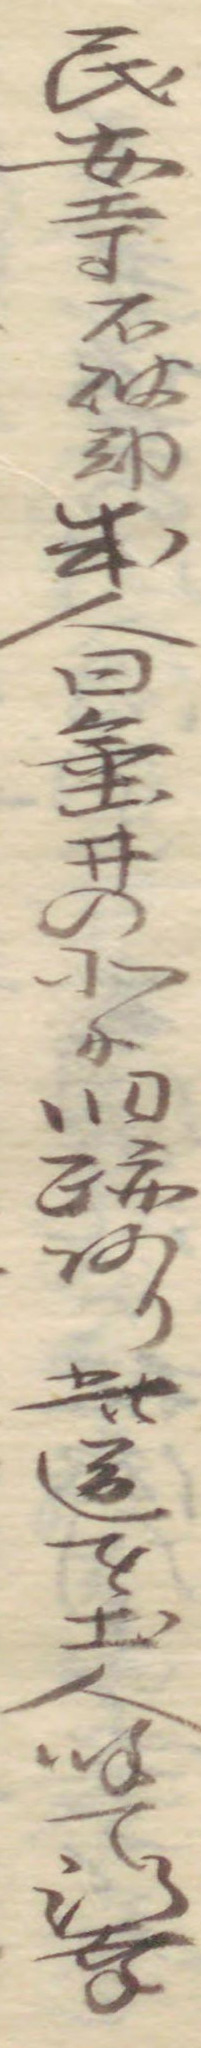民安寺不破郡或人曰垂井の北に旧跡あり此道を土人呼て行幸
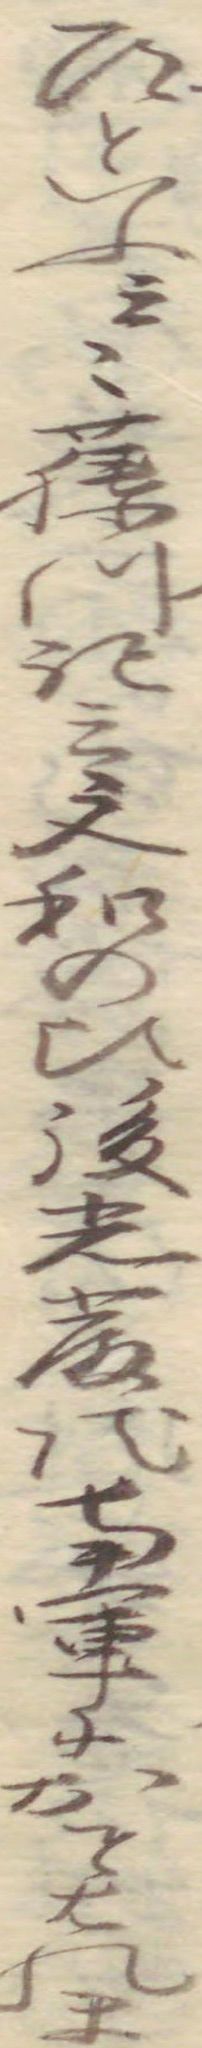道といふ云〻藤川記云文和の比後光厳院南軍におそはれま
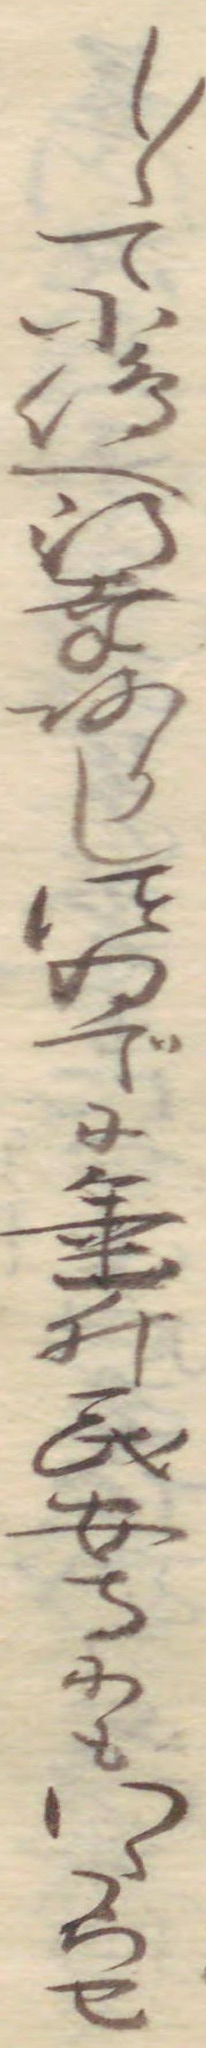し〳〵て小嶋へ行幸ありしつゐでに垂井民安寺にもわたらせ
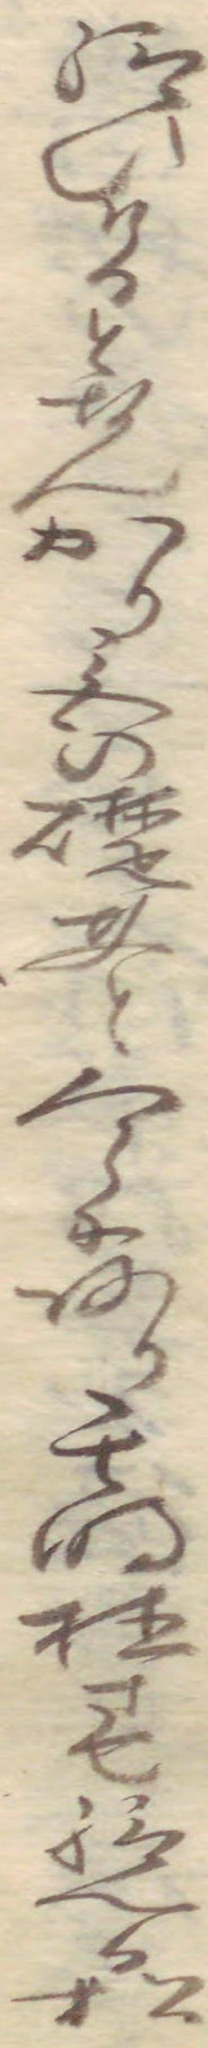給ひけるとなんかり宮の礎なと今にあり其時植させ給へる松
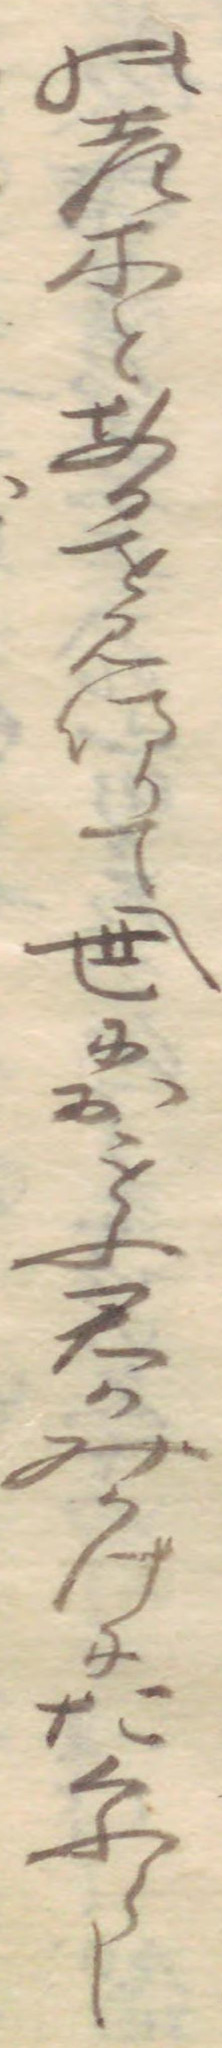の老木となるを見侍りて〽世におもふ君かみかけにたくふらし
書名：鶯宿雑記. 巻263-264
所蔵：国立国会図書館 National Diet Library, JAPAN
